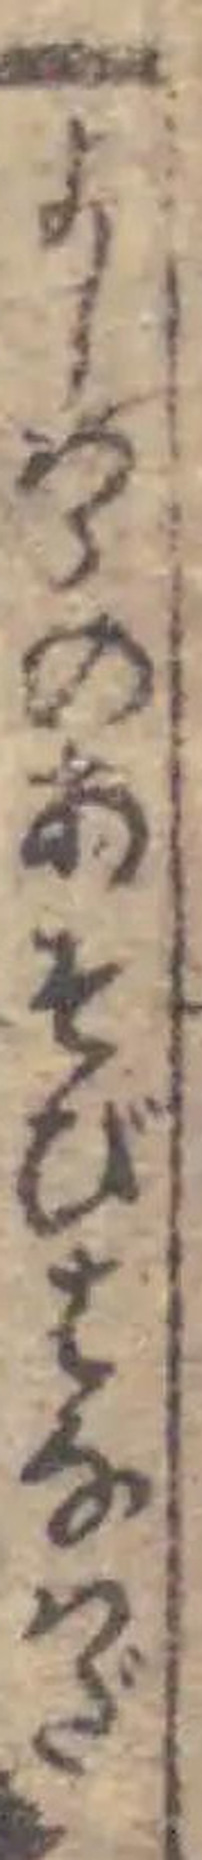よしはらのあそびはなはだ
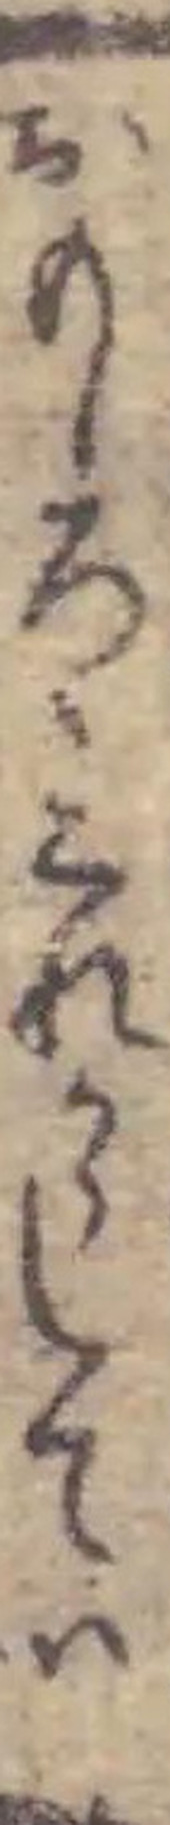おもしろくこれからしては
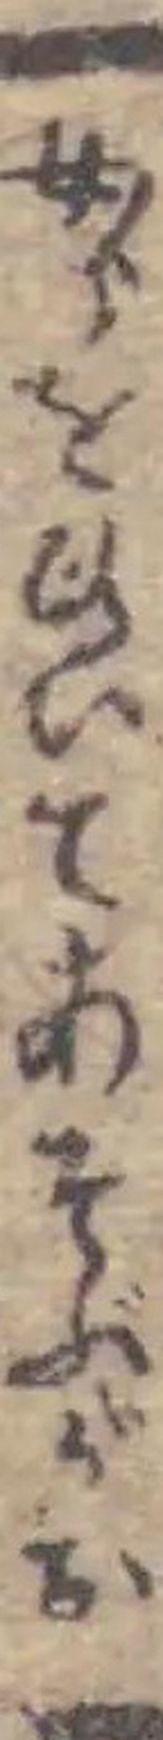女郎をひいてあそぶがお
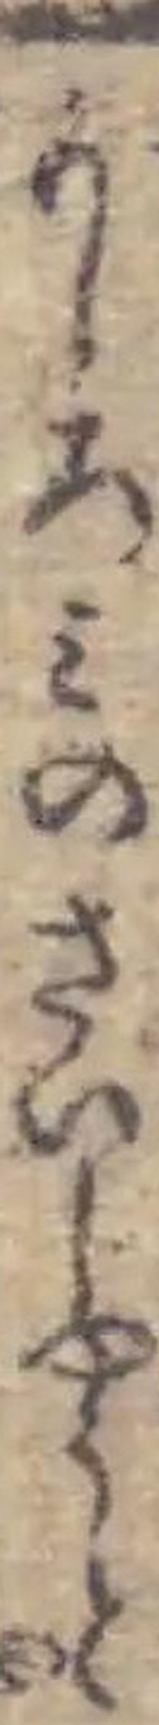もしろみのさいじやうと
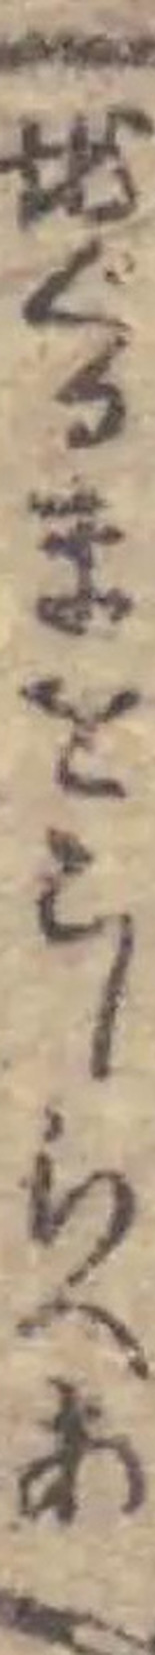地ぐるまをこしらへあ
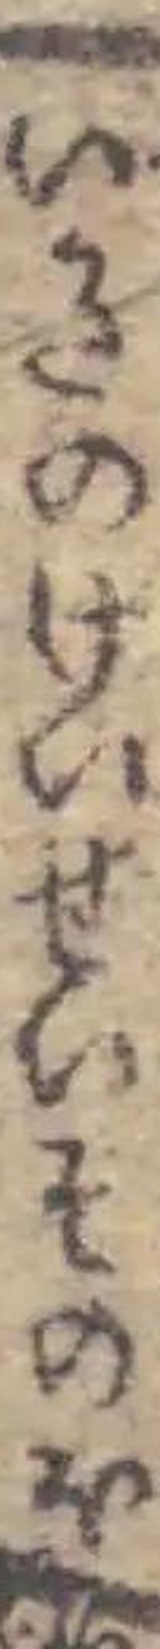いかたのけいせいそのほ
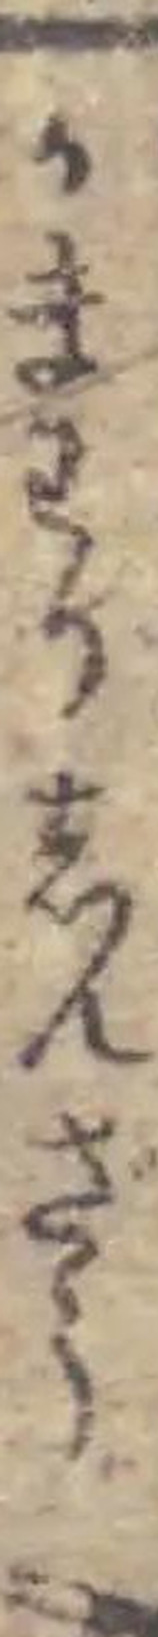かまわりしんざう
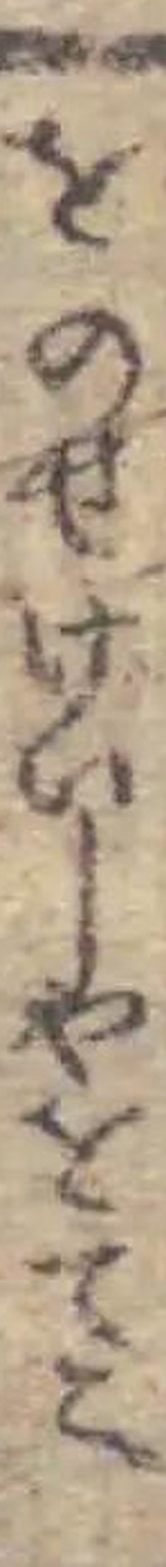をのせけいしやをてこ
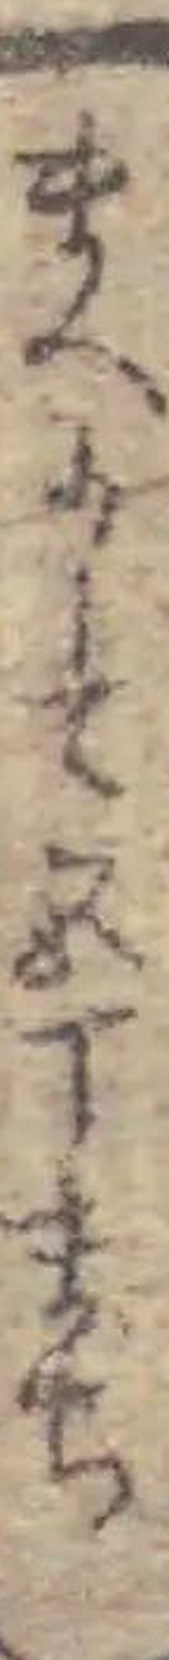まへにして五丁まち
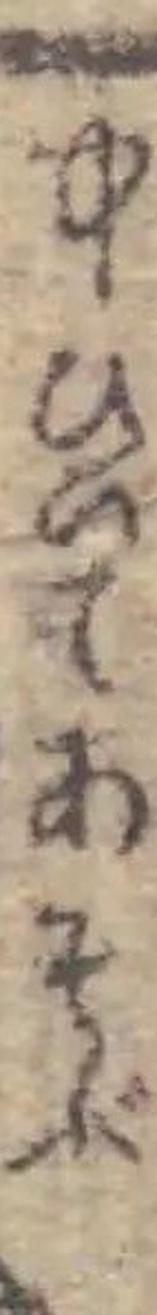中ひいてあそぶ
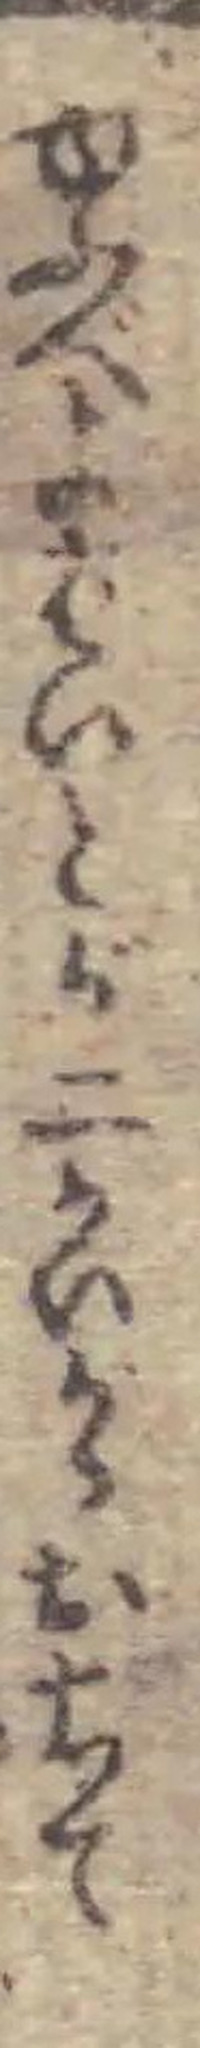ゆふべよいとが二かいからおちて
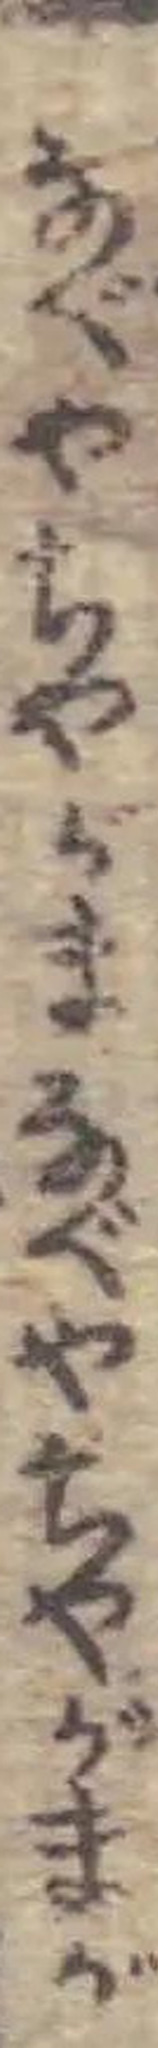なべやちやがまなべやちやがまが
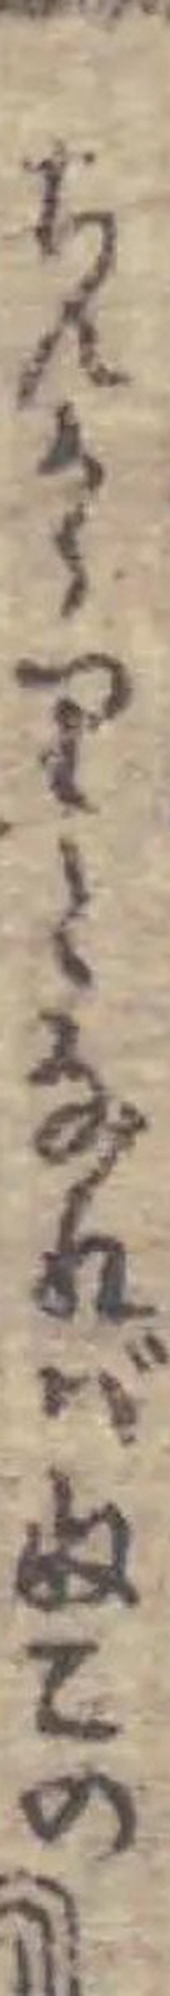ちんろうりとなればねこの
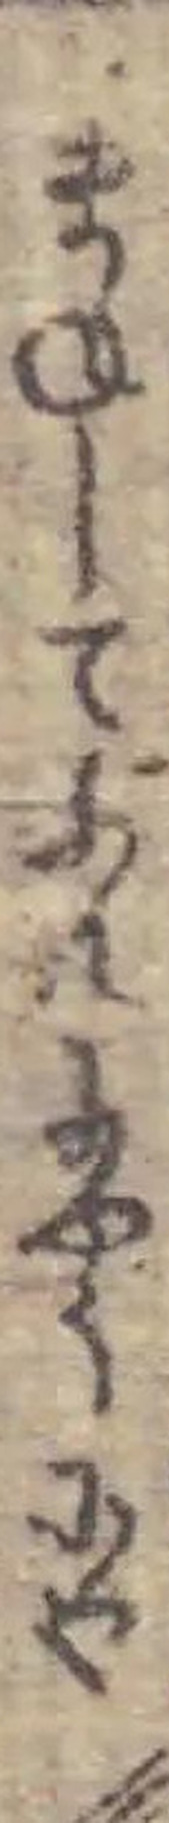まねしてふんにやうにや
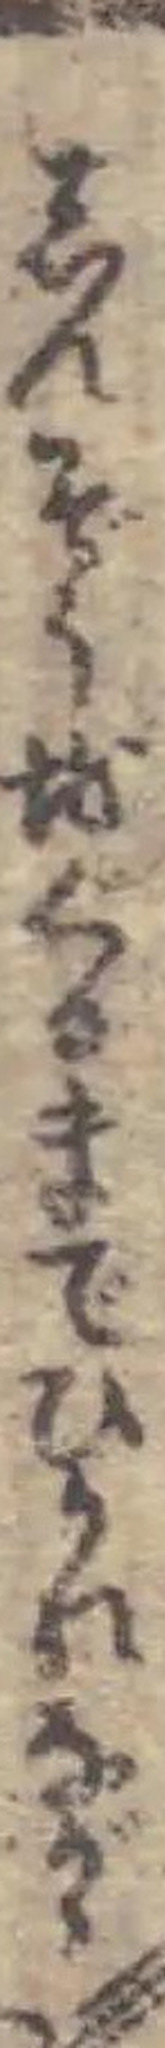しんぞう地くるまでひかれながら
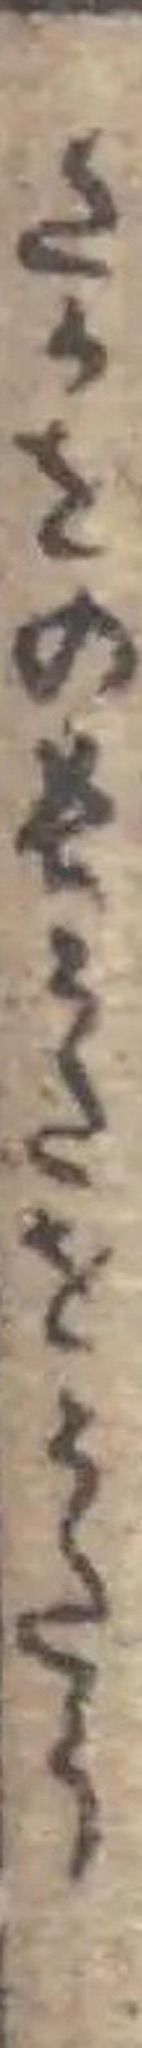たかをの長うたをうたう
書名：色男其処此処 3巻
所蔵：国立国会図書館 National Diet Library, JAPAN
